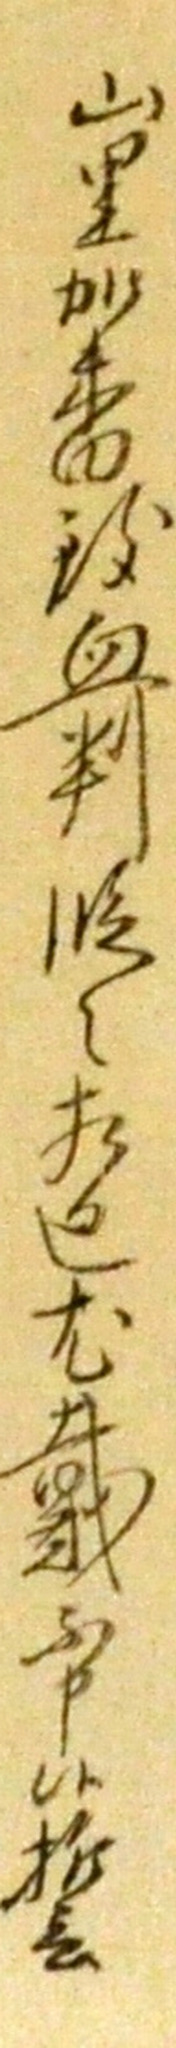山里加番致血判段々相廻尤戴不申候誓
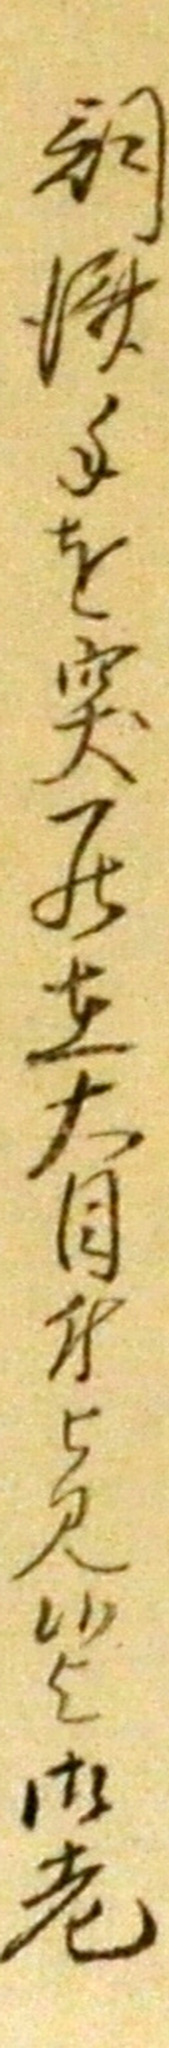詞済手を突罷在大目付被見候と御老
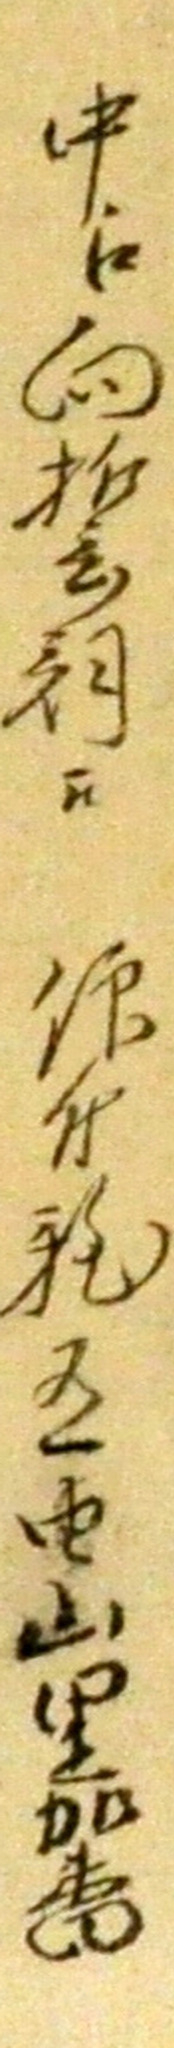中え向誓詞被仰付難有由山里加番
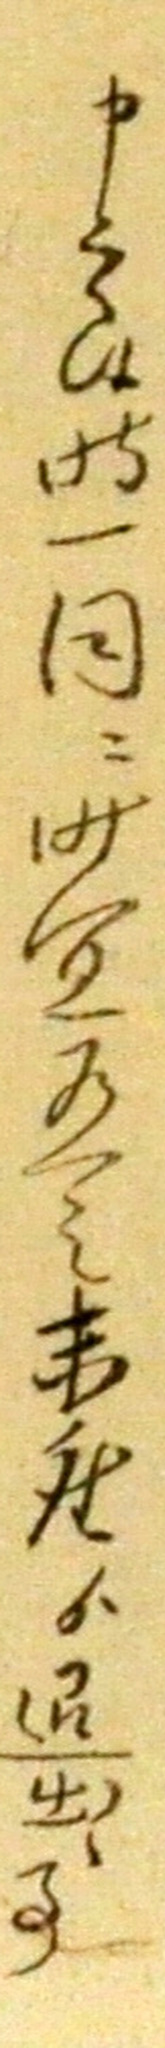申之候時一同に時宜有之末座ゟ退出候事
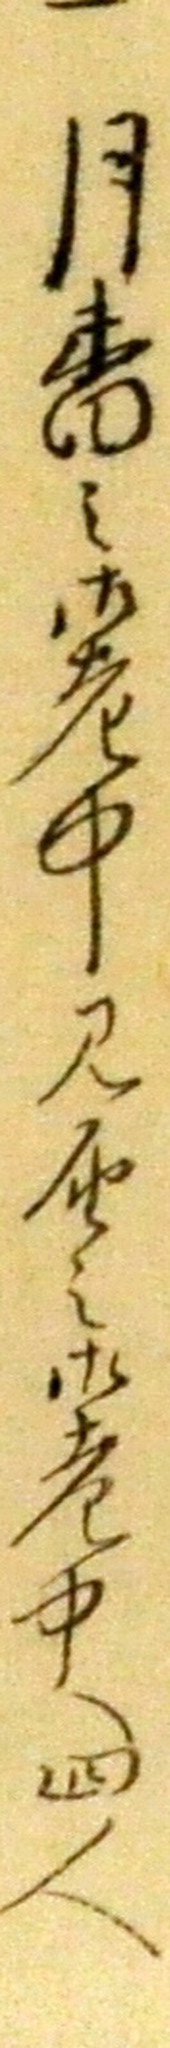一月番之御老中見届之御老中へ四人
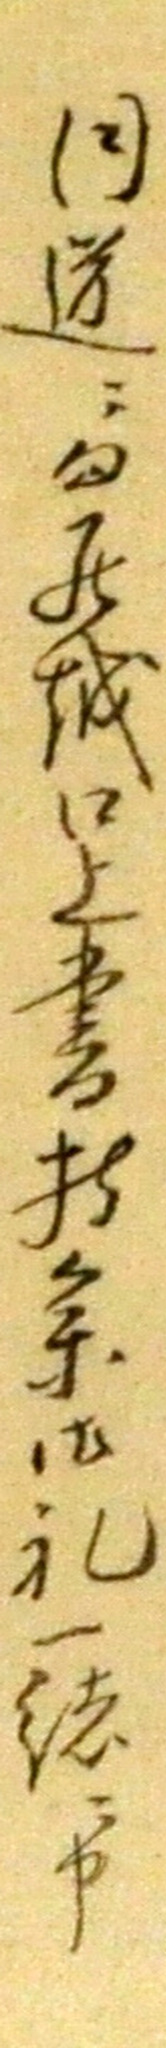同道に而罷越口上書持参御礼一緒に申
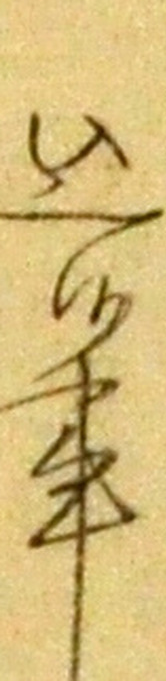込候事
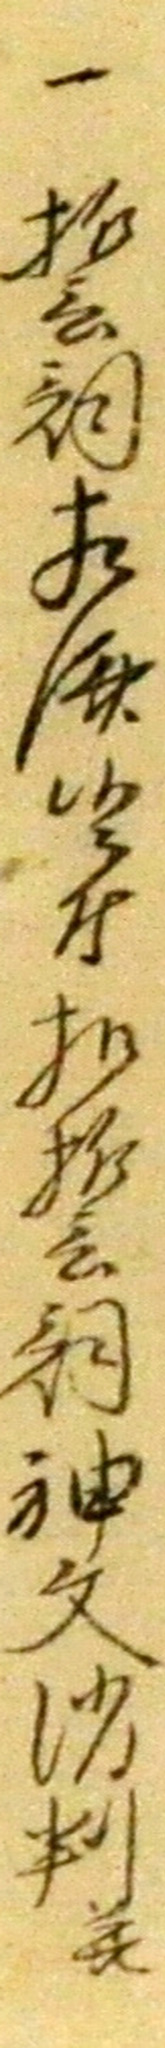一誓詞相済候に付扣誓詞神文消判并
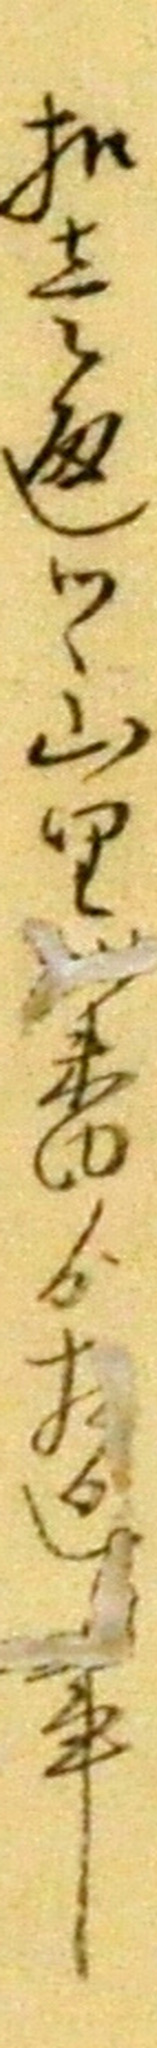扣壱通ツヽ山里加番ゟ相廻候事
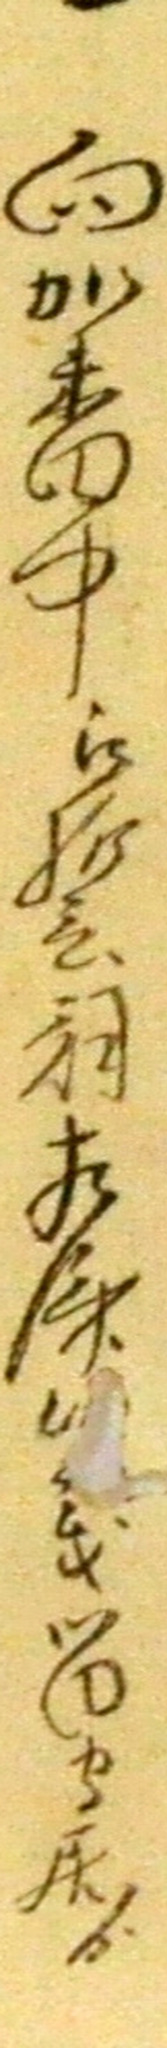一向加番中え誓詞相済候義留守居ゟ
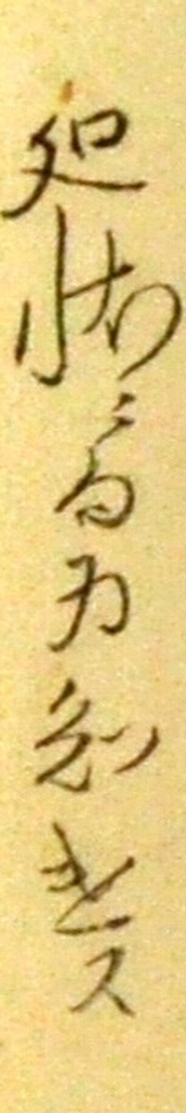廻状に而為知遣ス

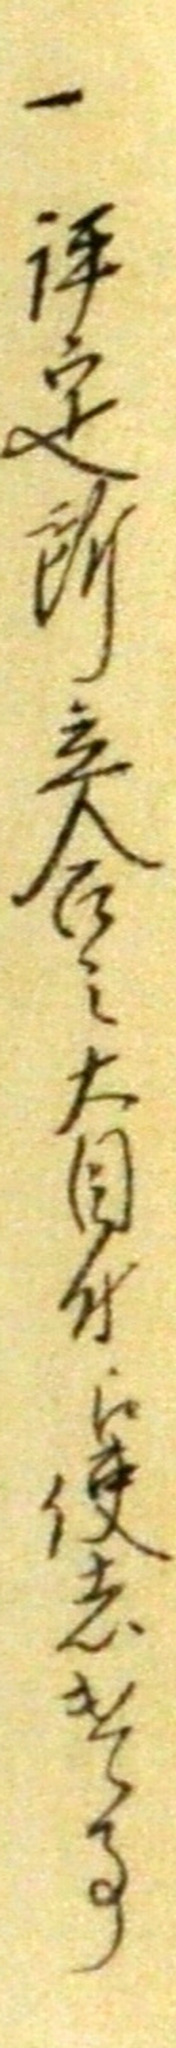一評定所立合之大目付え使者遣候事
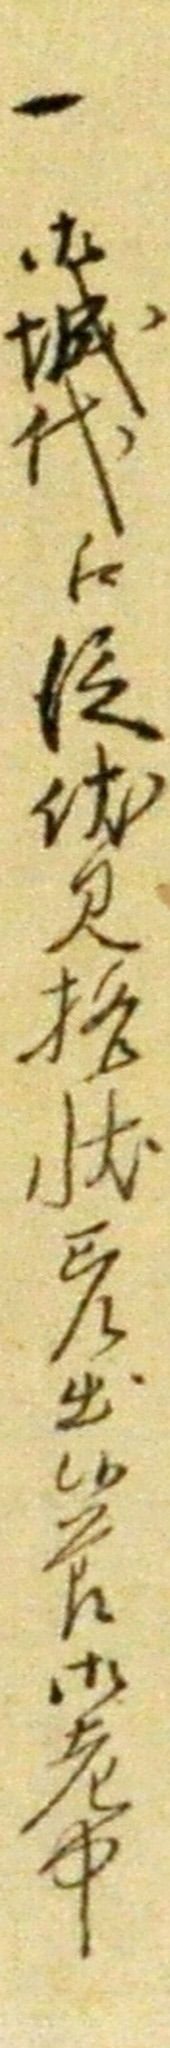一御城代え従伏見様状差出候節御老中
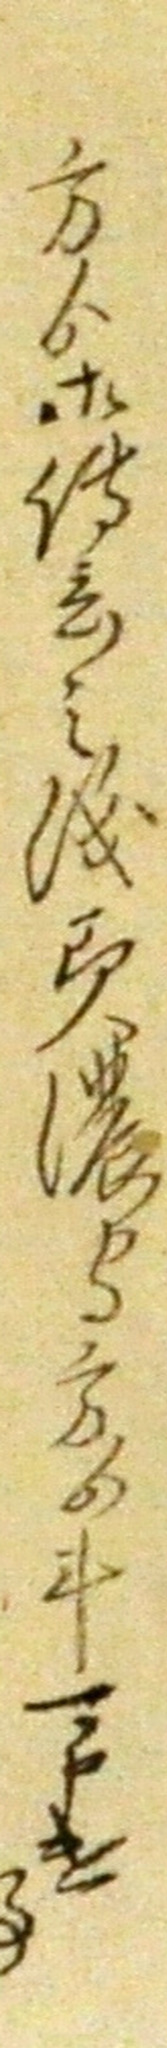方ゟ御伝言之儀美濃守方ゟ計可申遣事
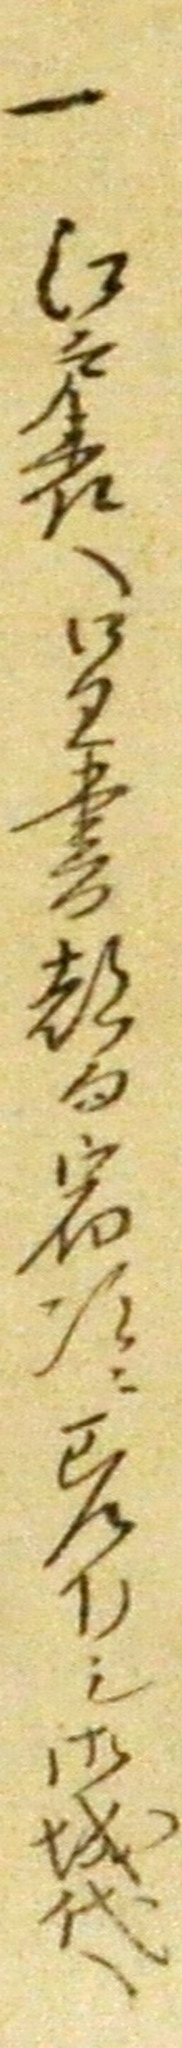一江戸表ヘ口上書都而宿次に差下シ御城代ヘ
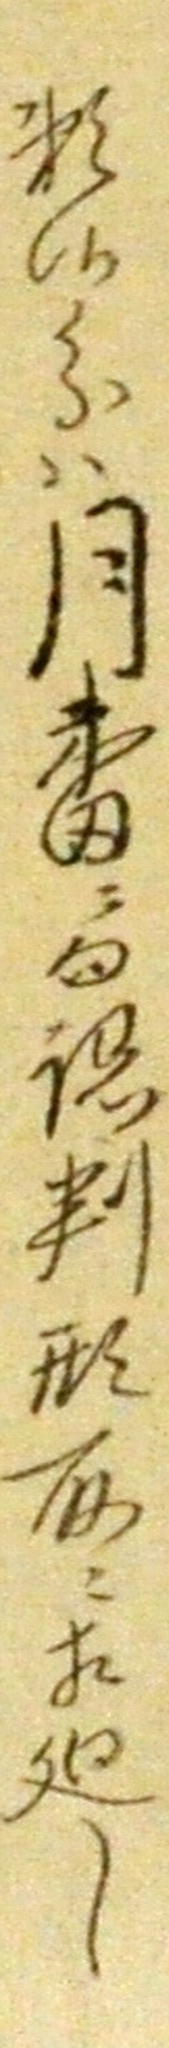頼候分は月番に而認判形取に相廻し
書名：大阪加番関係諸書留〔一括〕
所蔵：伊那市立高遠町図書館・合同会社AMANE
